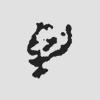解
